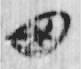困
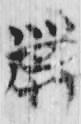業
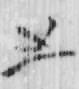之
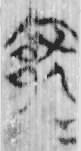犬
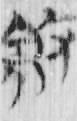叙
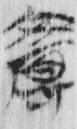○（鴈）
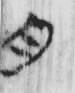肉
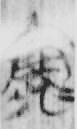彔
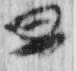旦
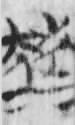灋
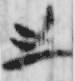之
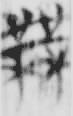無
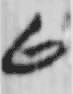㠯（以）
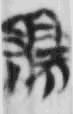○（歸）
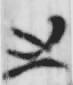之
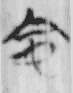{宀𠁩}
